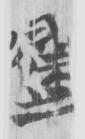{歸}
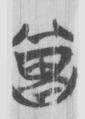曾
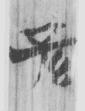孫
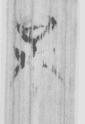某
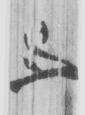之
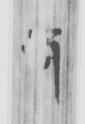邑
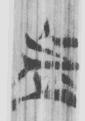者
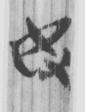奴
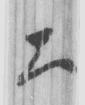云
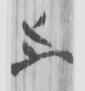之
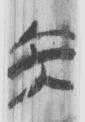內
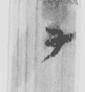九
